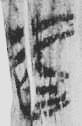百
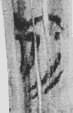勿（物）
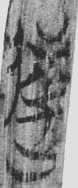○（失）
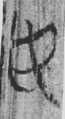女（如）
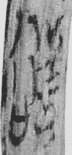欲
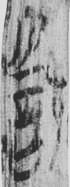○（察）
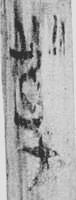○（一）
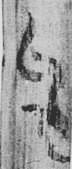卬（仰）
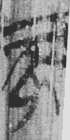而
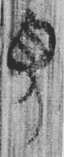視
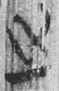之
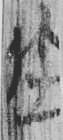○（俯）
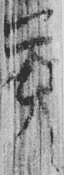而
